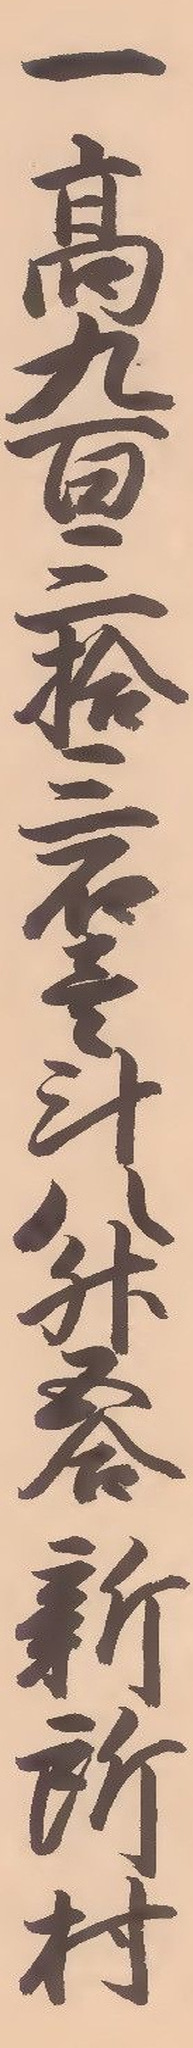一高九百三拾三石壱斗八升五合新所村
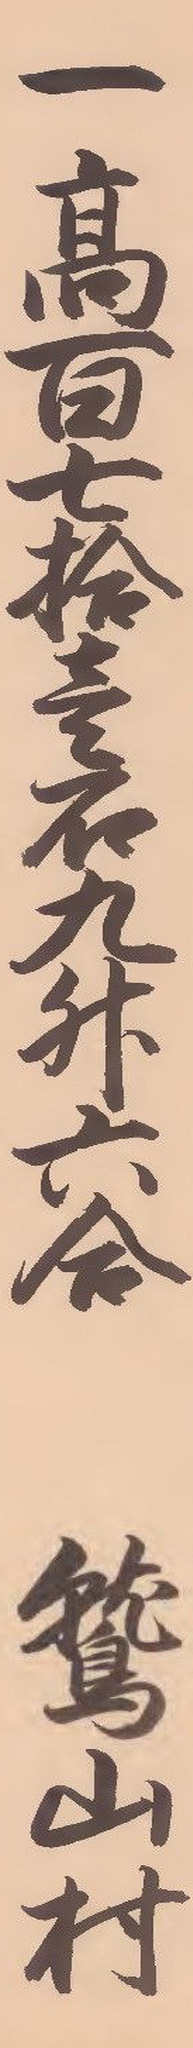一高百七拾壱石九升六合鷲山村
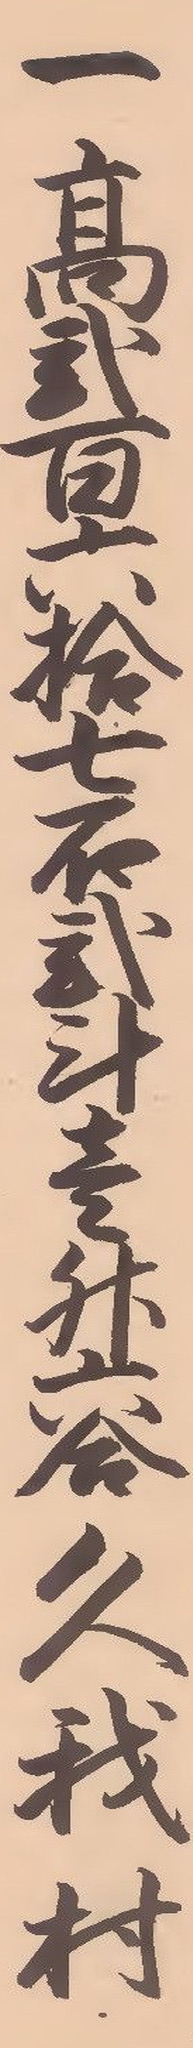一高弐百六拾七石弐斗壱升六合久我村
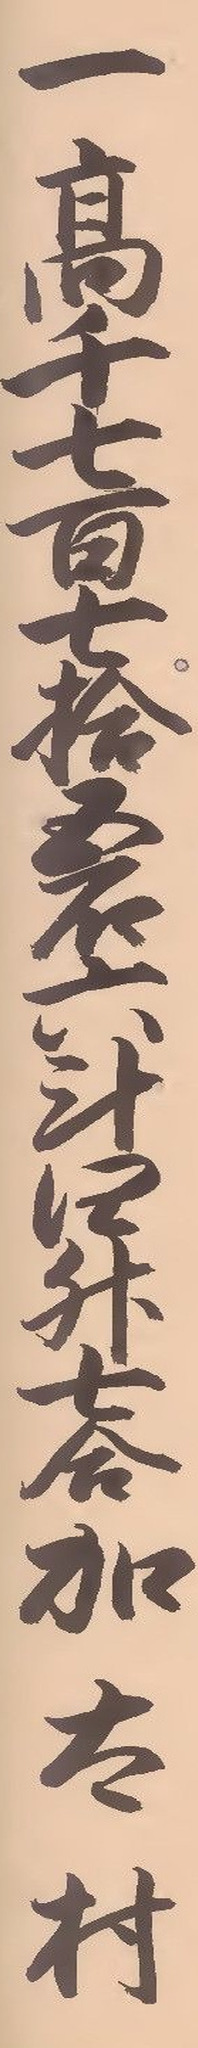一高千七百七拾五石六斗四升七合加太村
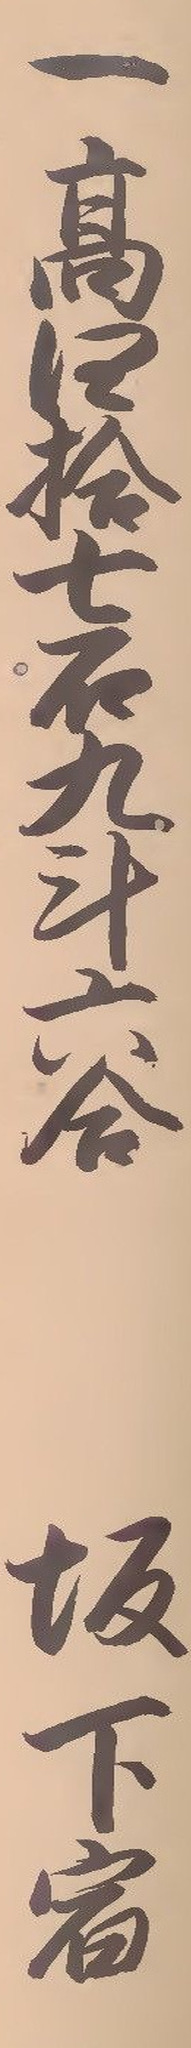一高四拾七石九斗六合坂下宿
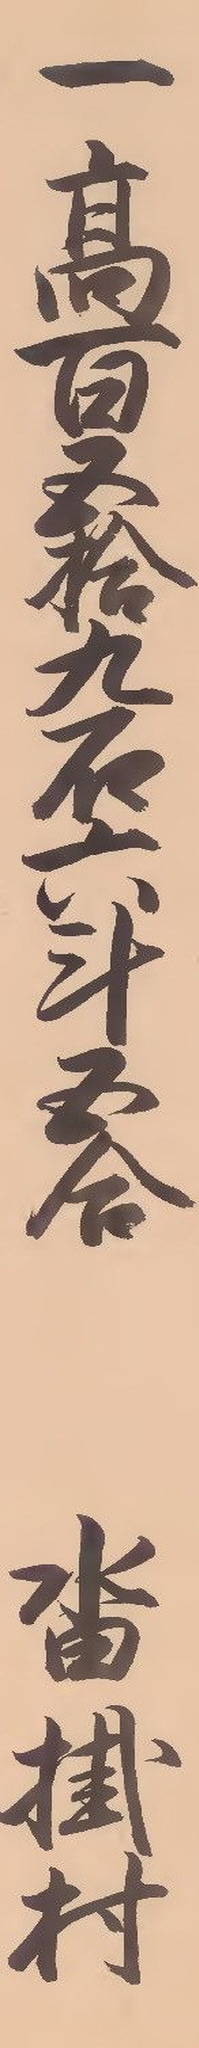一高百五拾九石六斗五合沓掛村
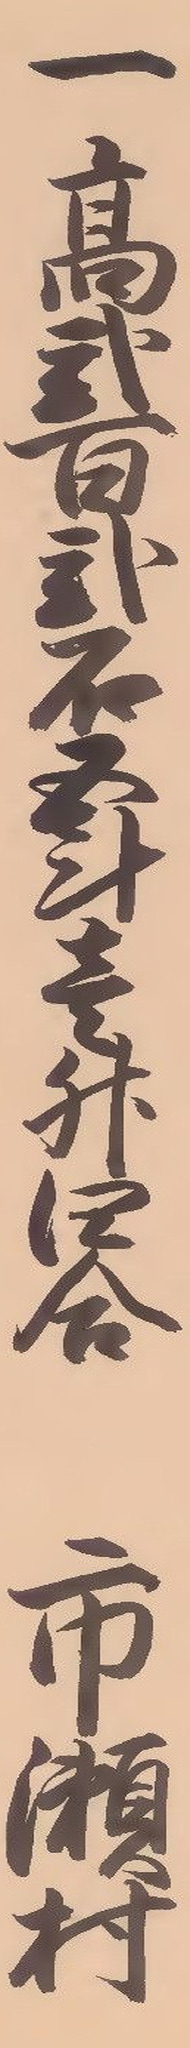一高弐百弐石五斗壱升四合市瀬村
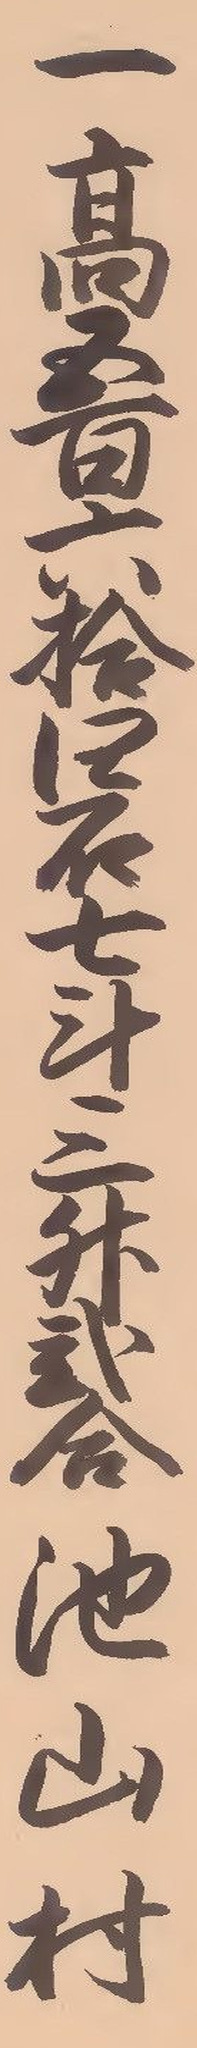一高五百六拾四石七斗三升弐合池山村

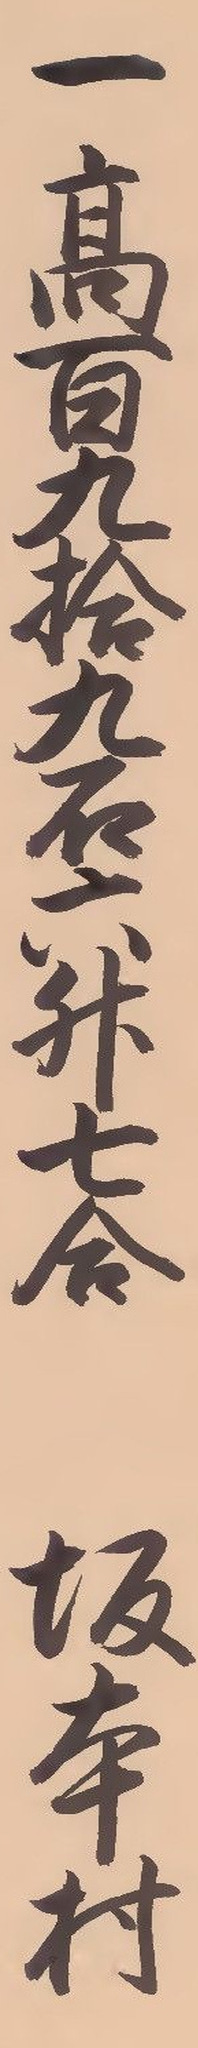一高百九拾九石六升七合坂本村
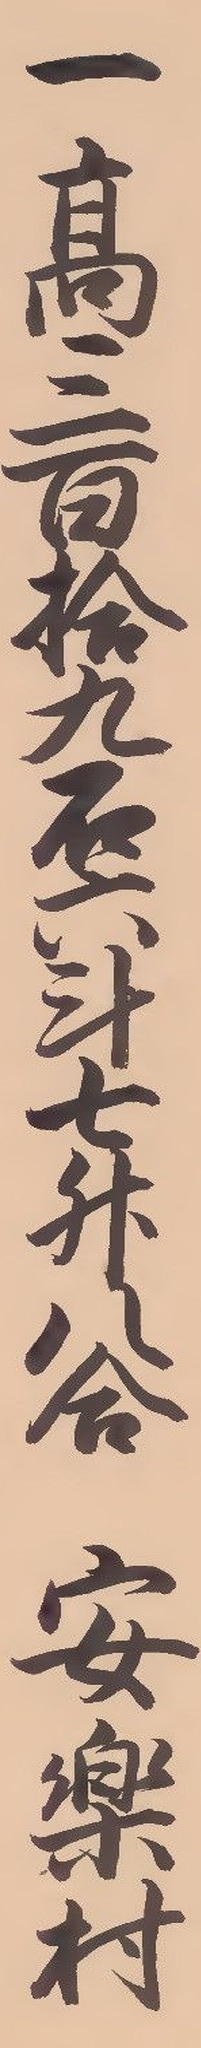一高三百拾九石六斗七升八合安楽村
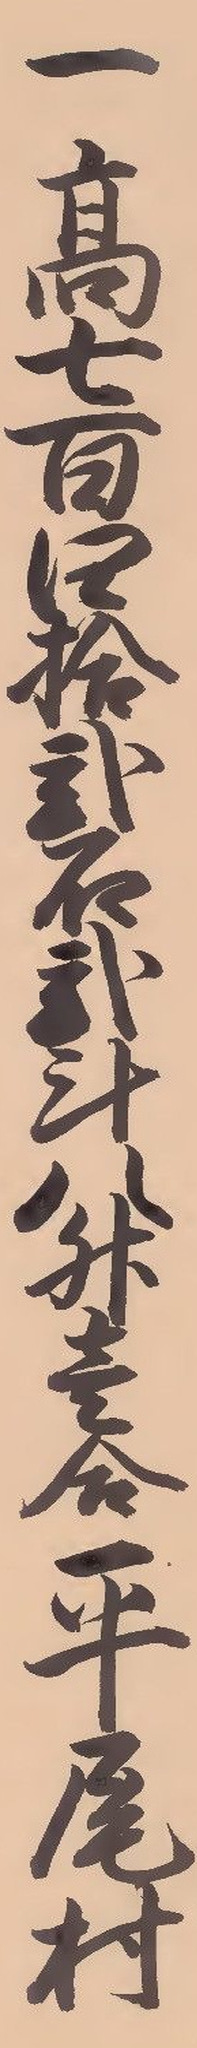一高七百四拾弐石弐斗八升壱合平尾村
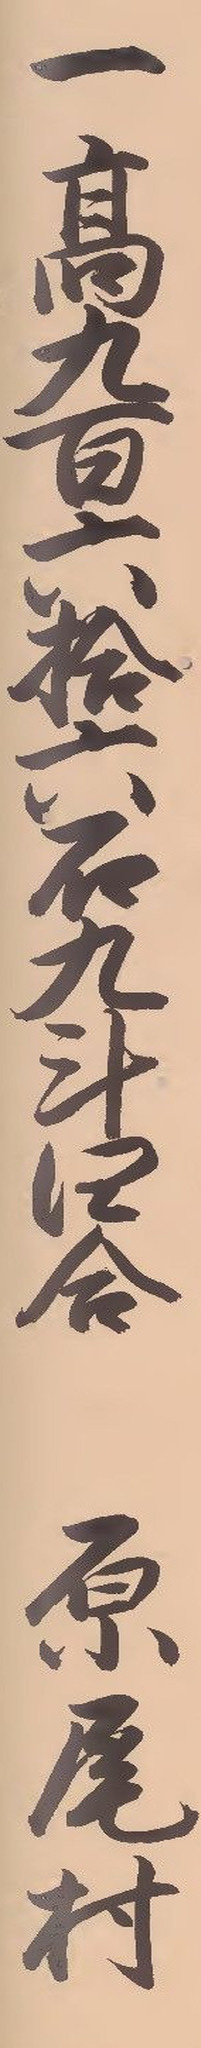一高九百六拾六石九斗四合原尾村
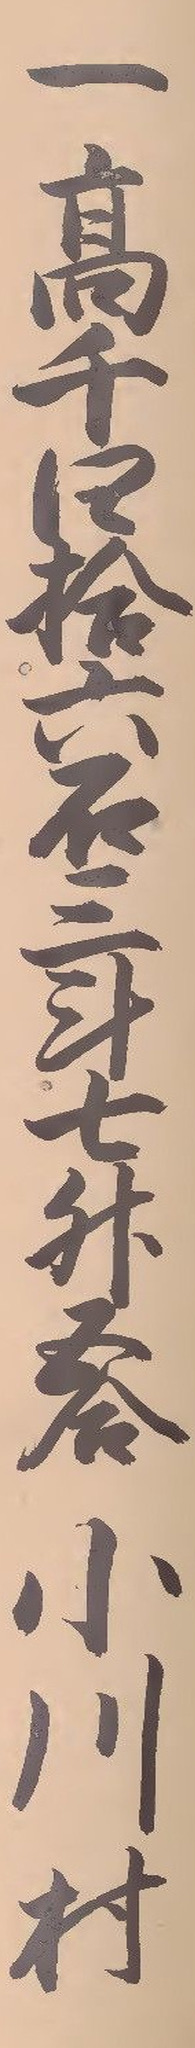一高千四拾六石三斗七升五合小川村
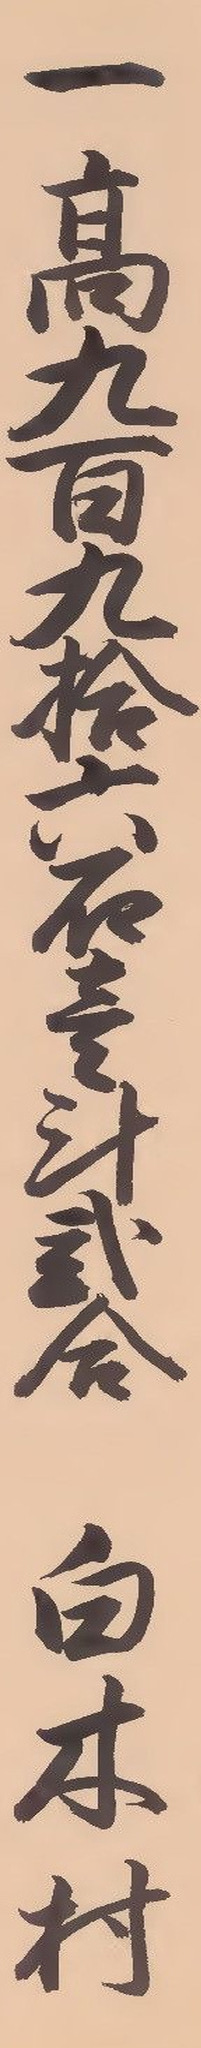一高九百九拾六石壱斗弐合白木村
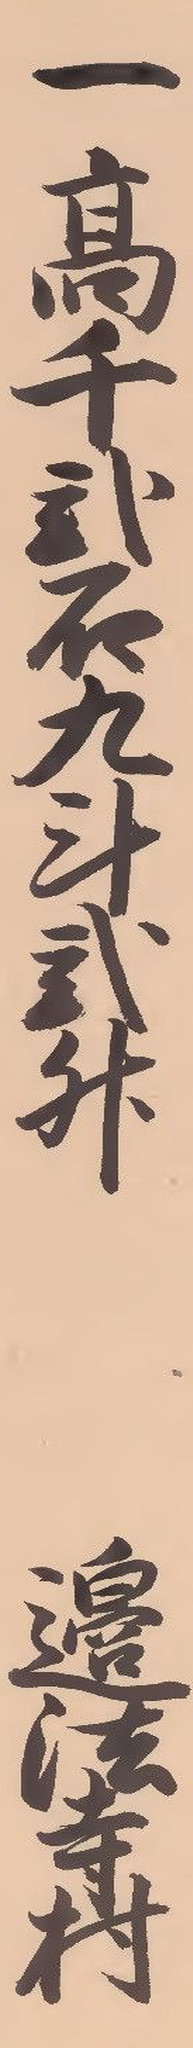一高千弐石九斗弐升辺法寺村
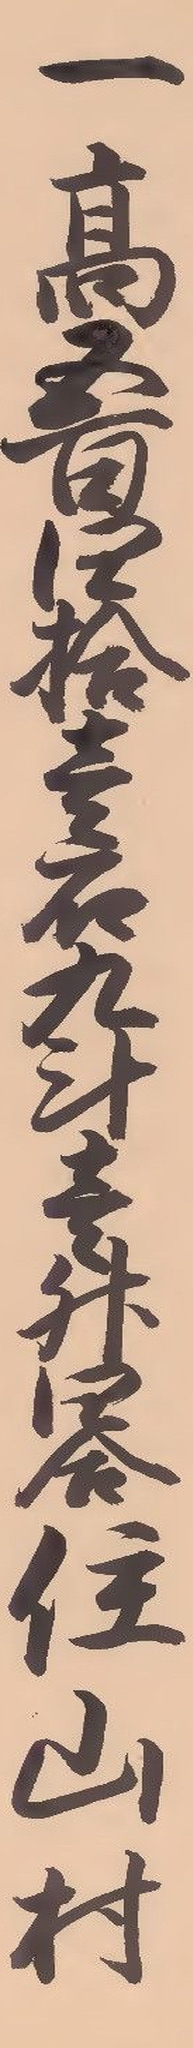一高五百四拾壱石九斗壱升四合住山村
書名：伊勢国郷帳
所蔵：国立公文書館 National Archives of Japan
